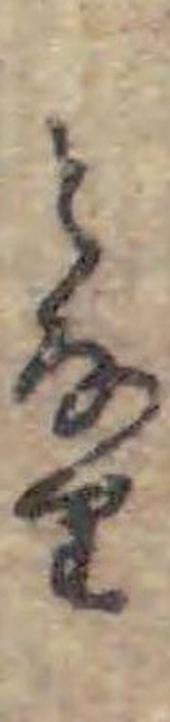となり
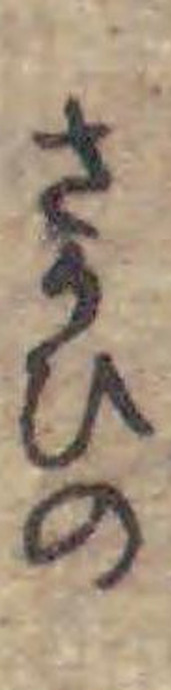さかひの
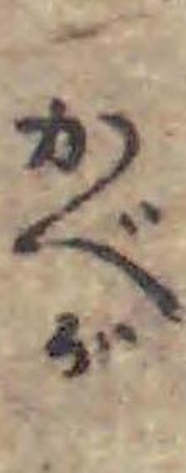かべが
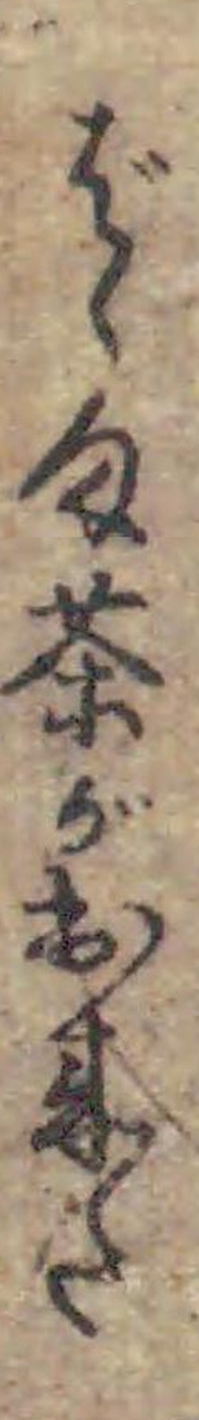ばゝさま茶が出来た

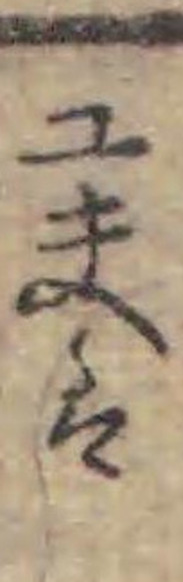工夫は
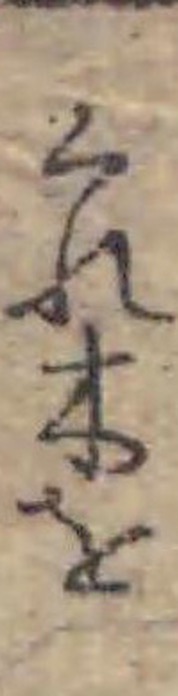くれ木を
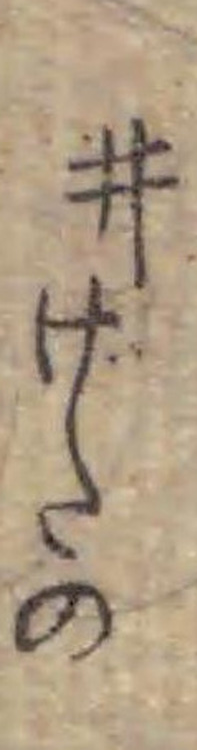井げたの
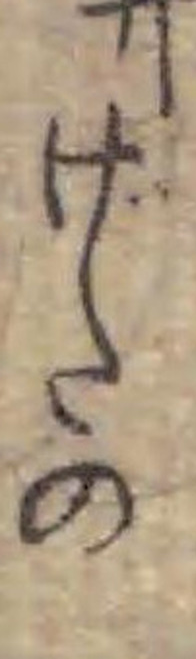井げたの
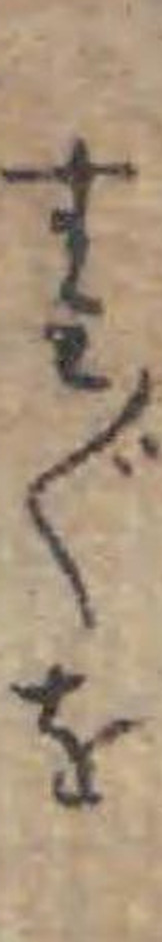すみ〴〵を
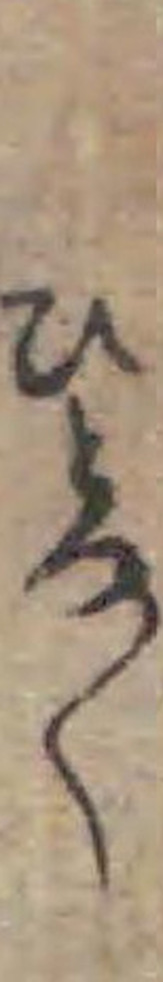ひとつ〳〵
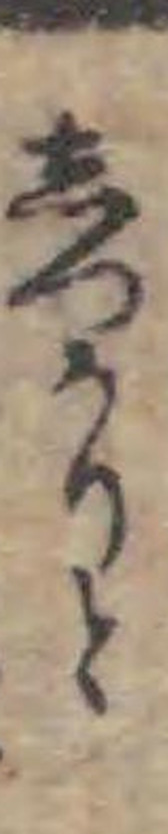しつかりと
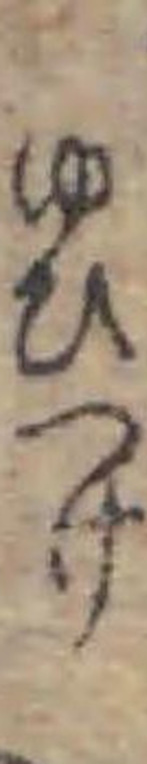ゆひつけ
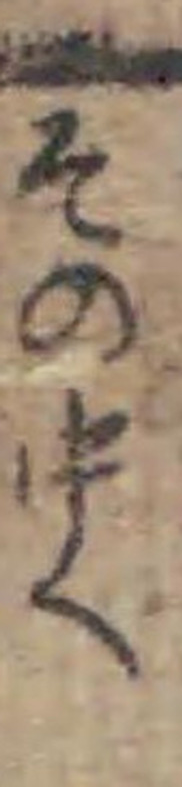その中へ
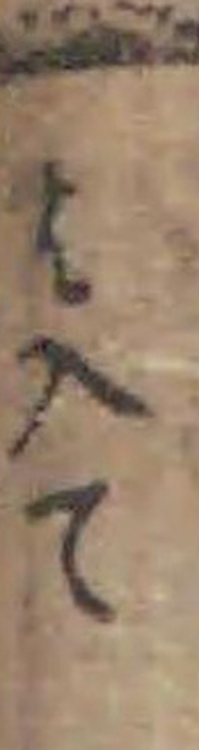は入て
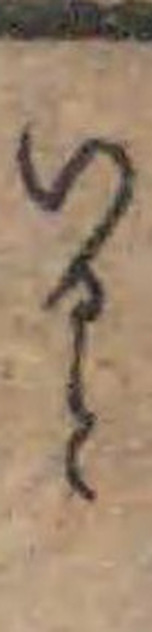いると
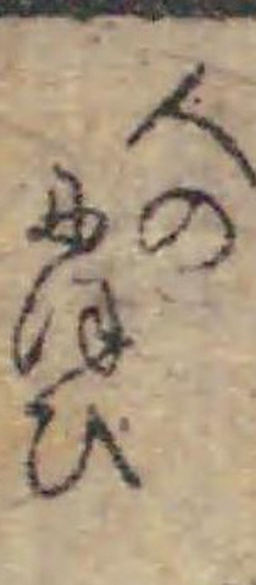にほひ
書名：虚言八百万八伝 : 3巻
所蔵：国立国会図書館 National Diet Library, JAPAN
